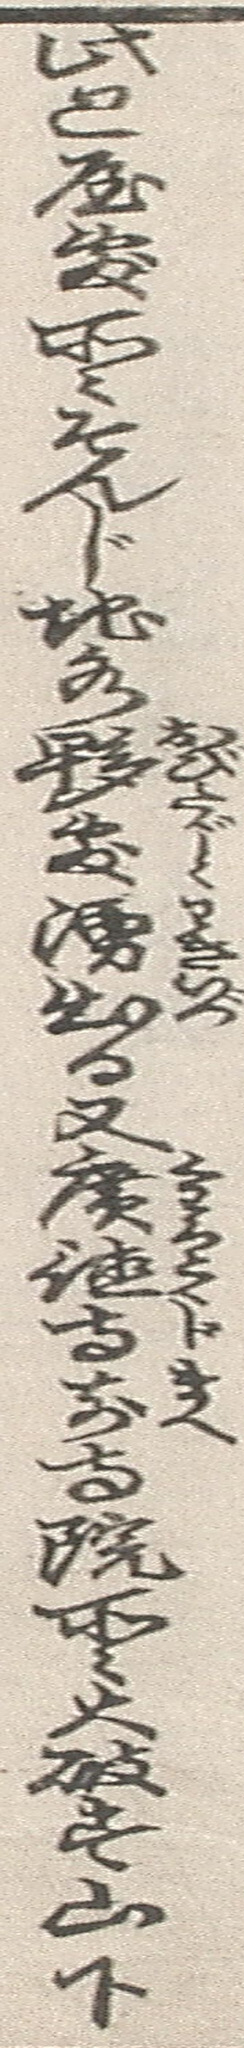此辺屋敷所々そんじ地水夥敷湧出る又広徳寺前寺院所々大破す山下
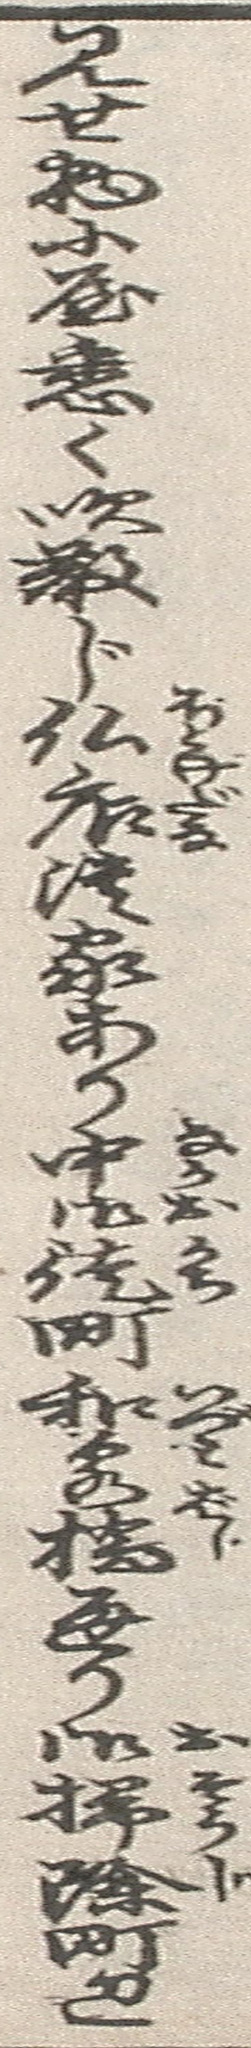見せ物小屋悉く吹散じ仏店潰家あり中御徒町和泉橋通り御掃除町辺
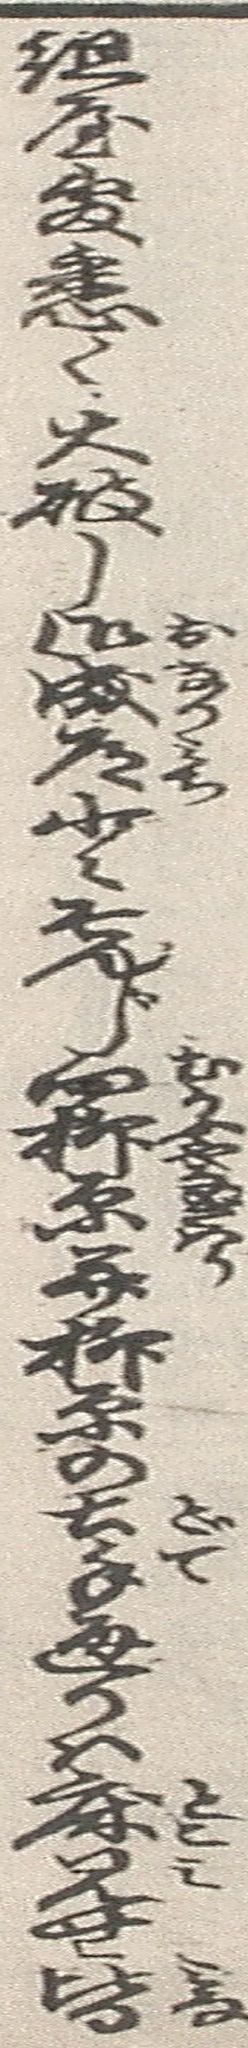組屋敷悉く大破し御成道少々そんじ向柳原并柳原の土手通りハ床見せ皆
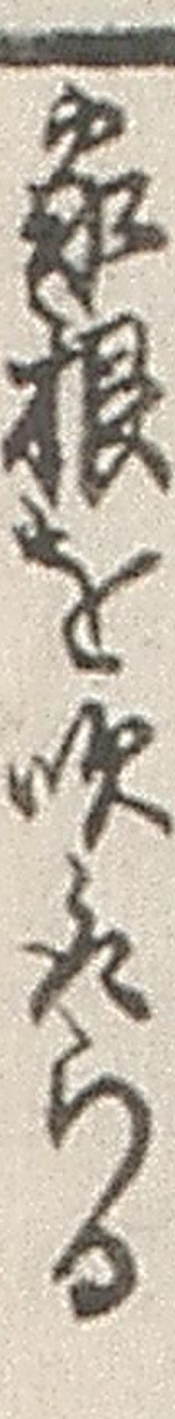家根吹取らる
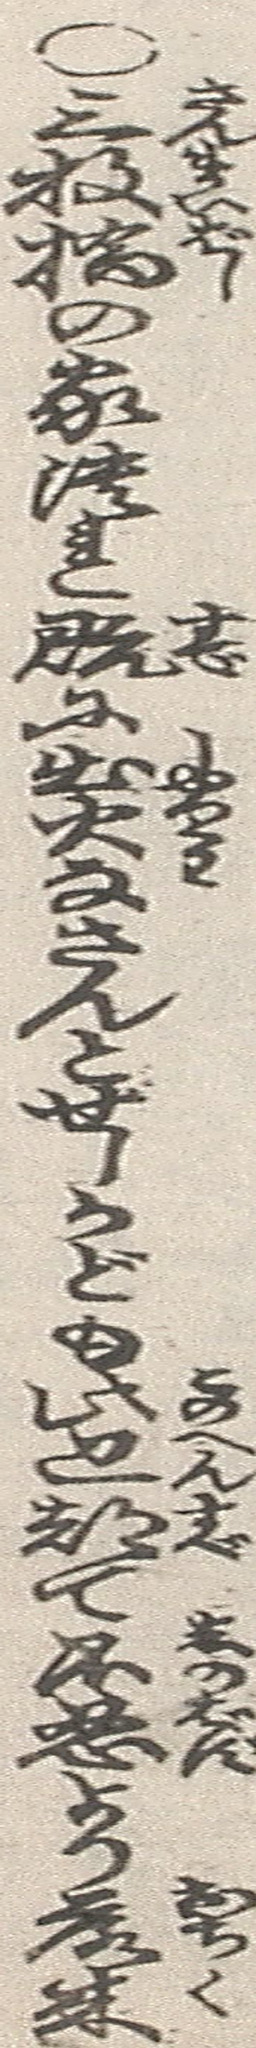◯三枚橋の家潰れ既に出火なさんとせしかども此辺都て不忍より落来
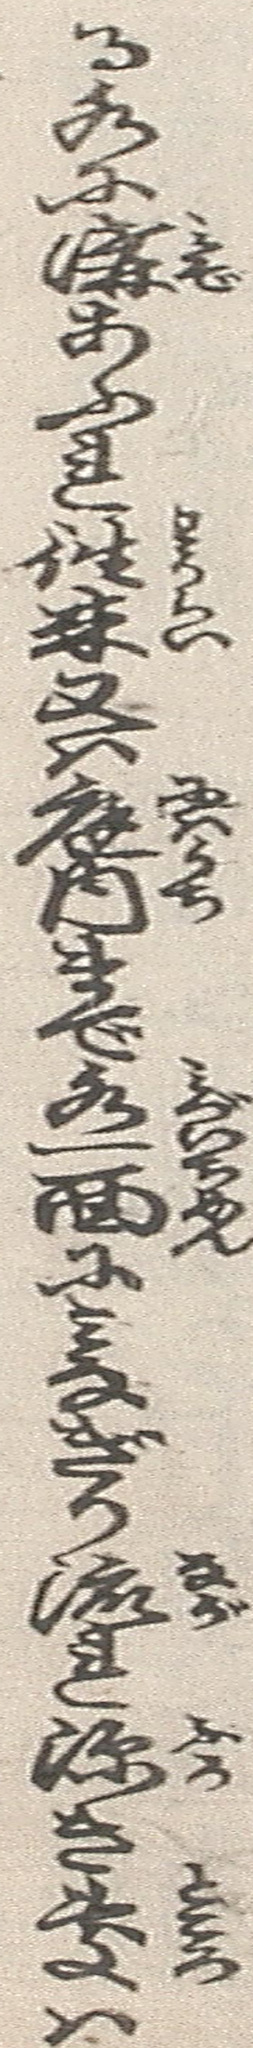る水に溝あふれ往来又ハ庭内まで水一面にみなぎり流れ深き処ハ
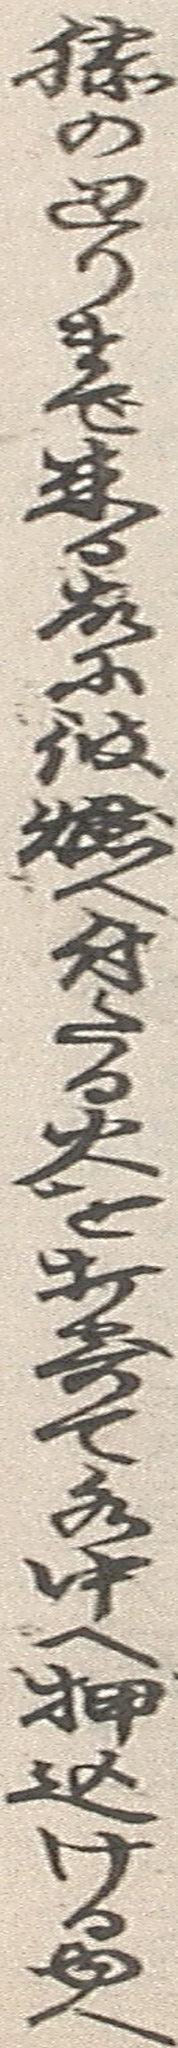膝の辺りまで来る故に彼燃へ付たる火を打寄て水中へ押込けるゆへ
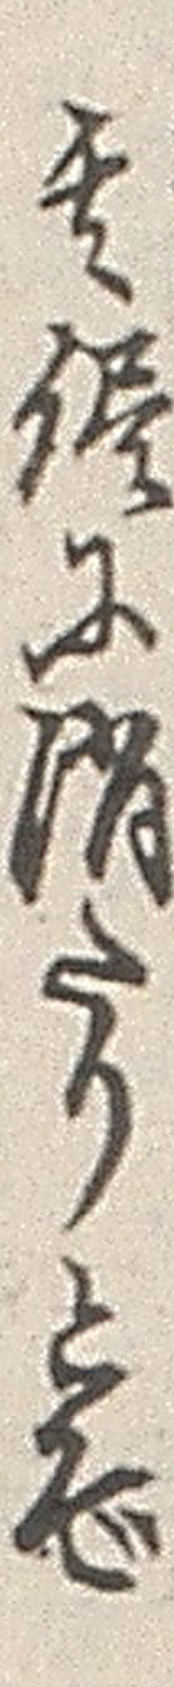其侭に消たりとぞ
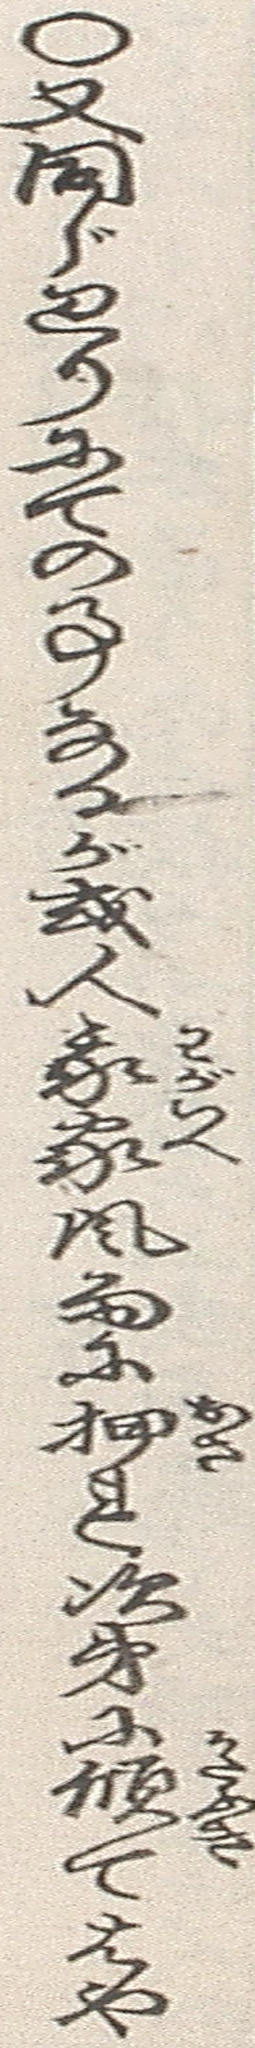◯又同じ辺りにての事なるが或人我家風雨に押れ次第に傾てはや
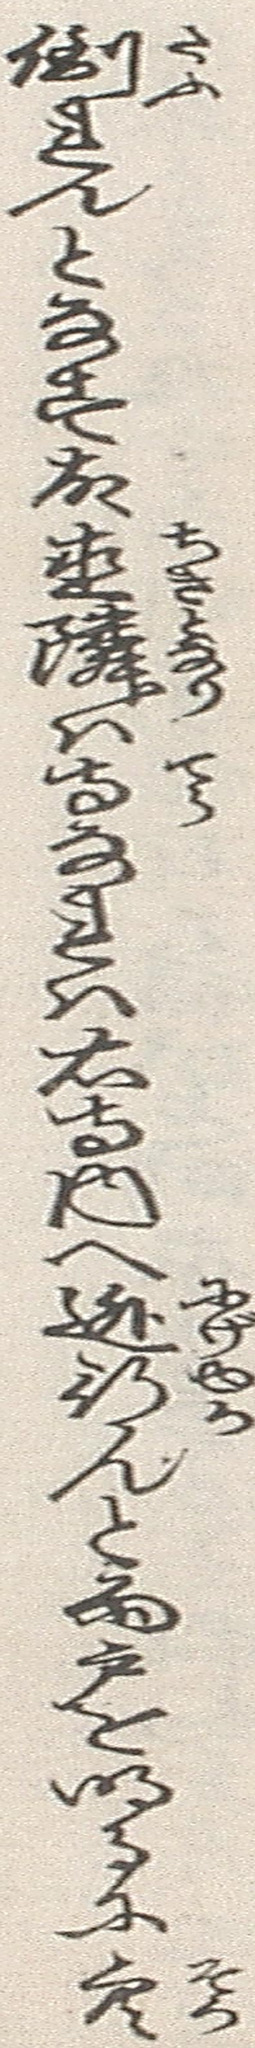倒れんとなす故直隣ハ寺なれハ右寺門へ逃行んと雨戸を明るに空
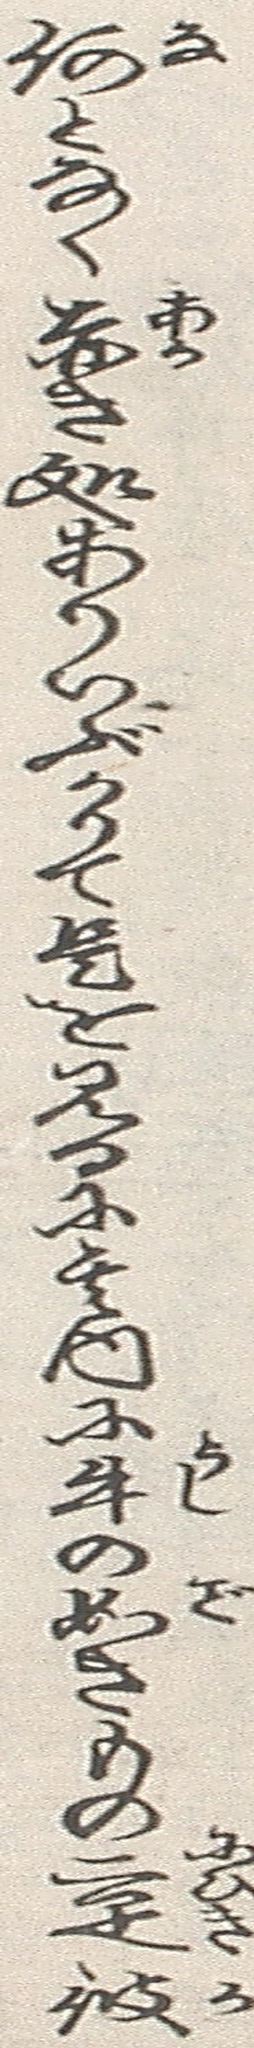何となく赤き処ありいぶかりて是を見るに其内に牛の如きもの二疋彼
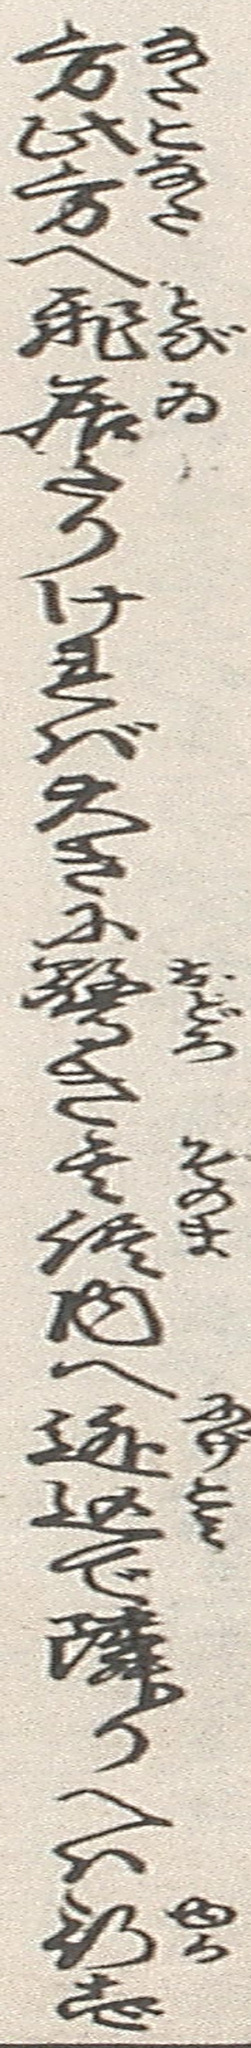方此方へ飛居たりれけれバ大きに驚き其侭内へ逃込で隣りへハ行ず
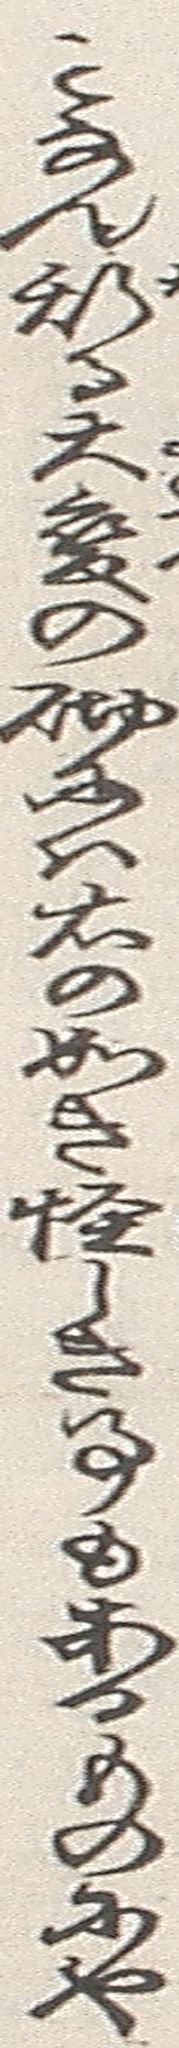となん斯る大変の砌にハ右の如き怪しき事もあるものにや
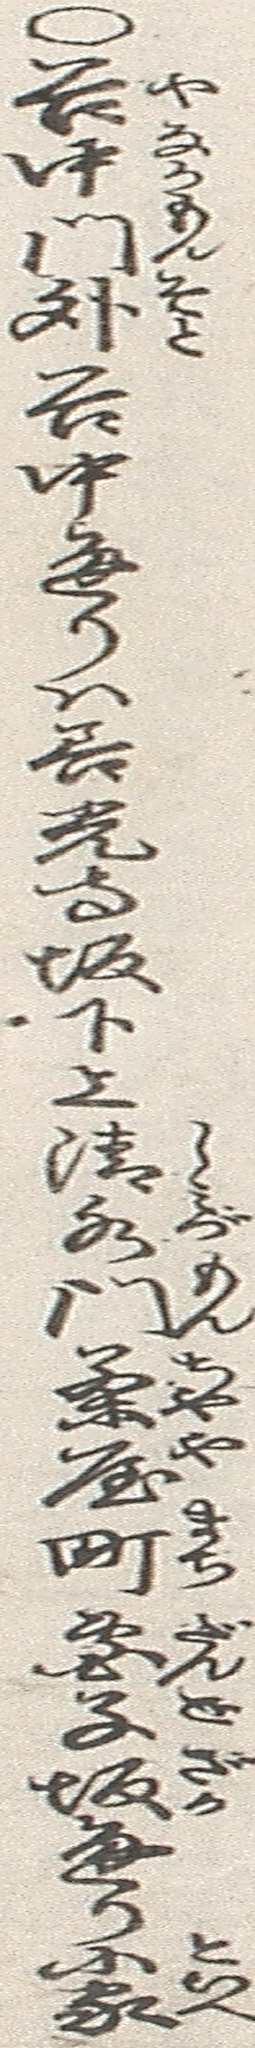◯谷中門外谷中通りハ善光寺坂下上清水門茶屋町団子坂通り小家
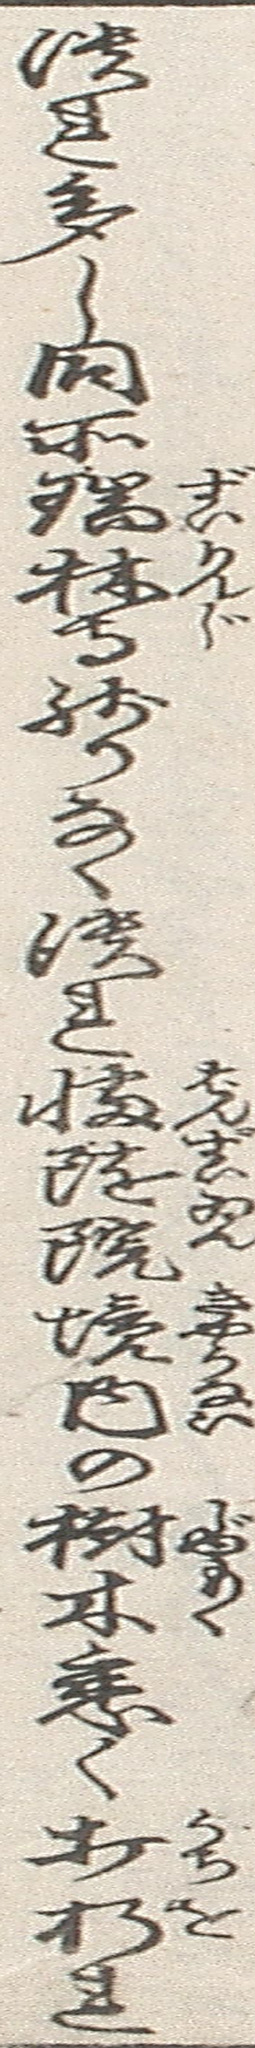潰れ多し同所瑞林寺残りなく潰れ潘随院境内の樹木悉く打折れ
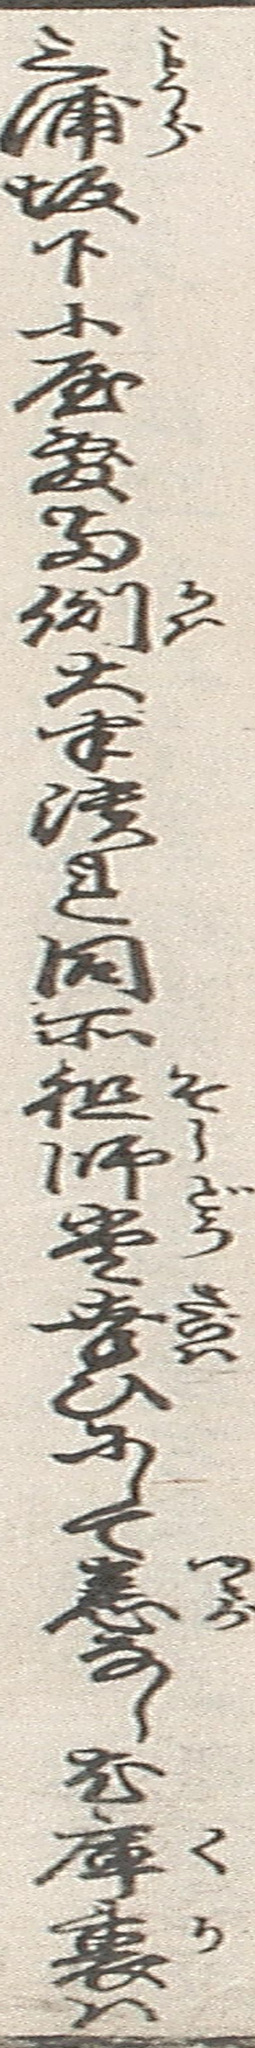三浦坂下小屋敷両側大半潰れ同所祖師堂幸ひにて恙なし尤庫裏ハ
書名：安政風聞集　上中下　全
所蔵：東京大学地震研究所図書室 Earthquake Research Institute Library, The University of Tokyo, JAPAN
